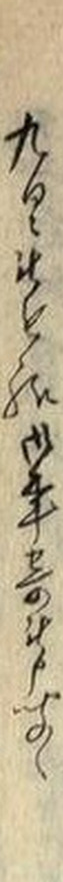九日ニ被進候様御年寄被申聞候
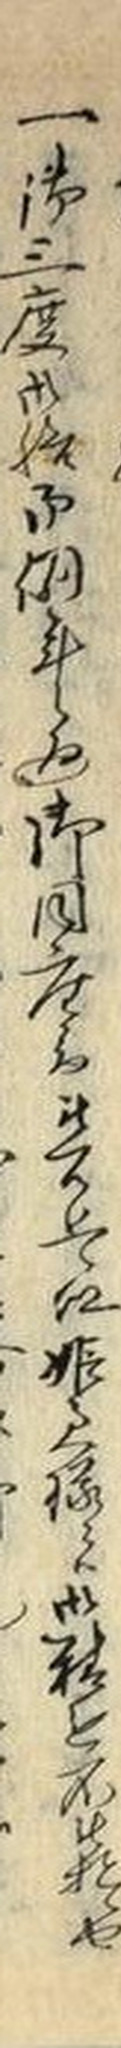一御三度御膳御例年之通御同座ニ而被召上候但姫君様ニハ御精進不被遊候由
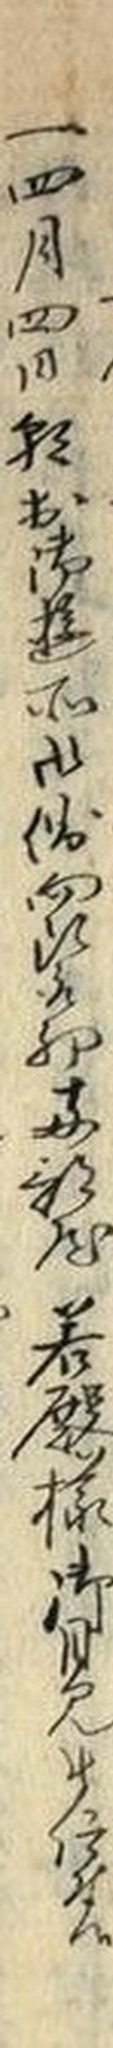一四月四日朝於御遊所御側向頭取初両部屋若殿様御目見被仰付候
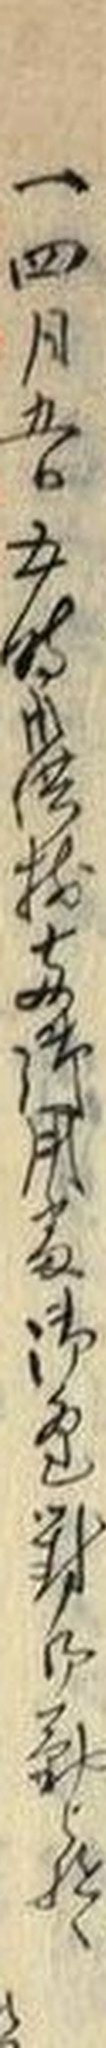一四月五日五時御供揃両御用番御逢対御勤被遊候
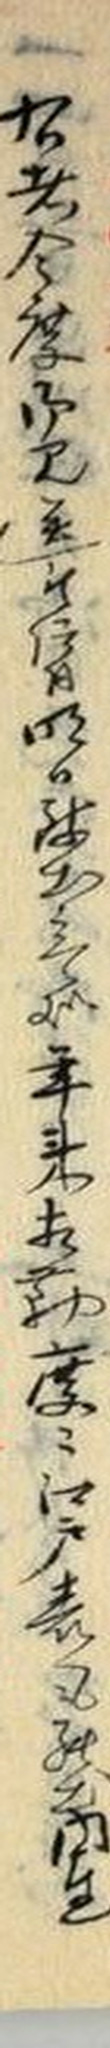右者今度御見送被仰付明日致出立候処年来相勤度々江戸表へも罷出内達
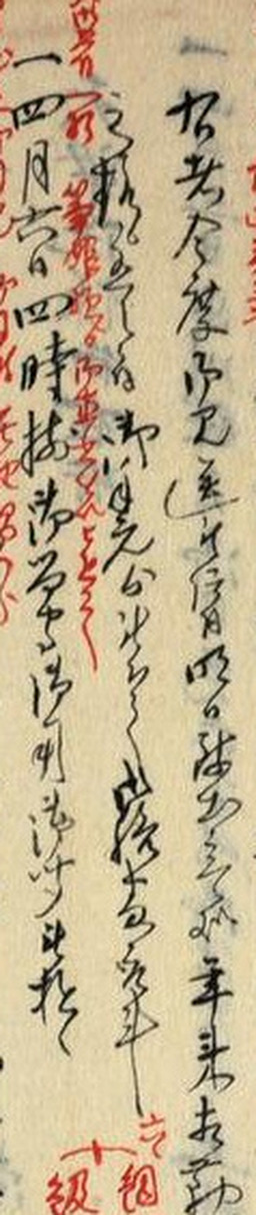之趣も有之候ニ付御手元ゟ被下之御膳番取計
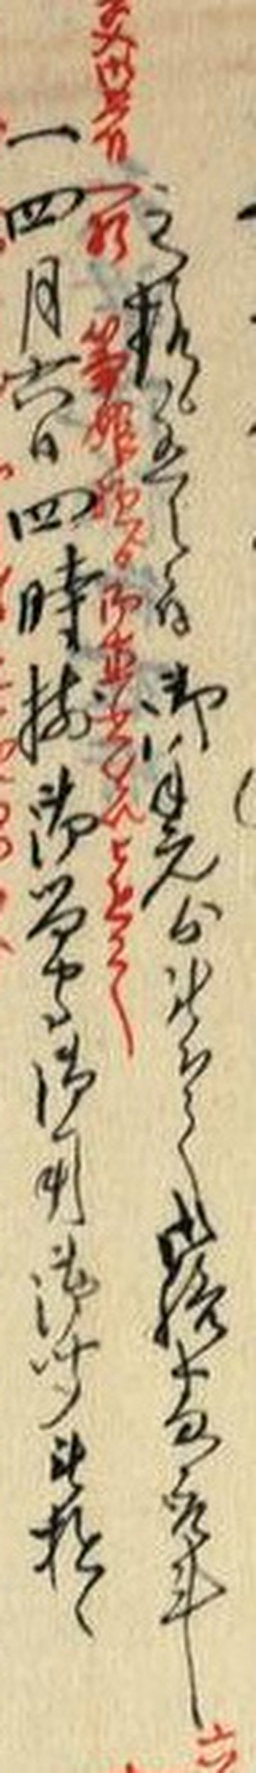一四月六日四時揃御留守御用御聞被遊候
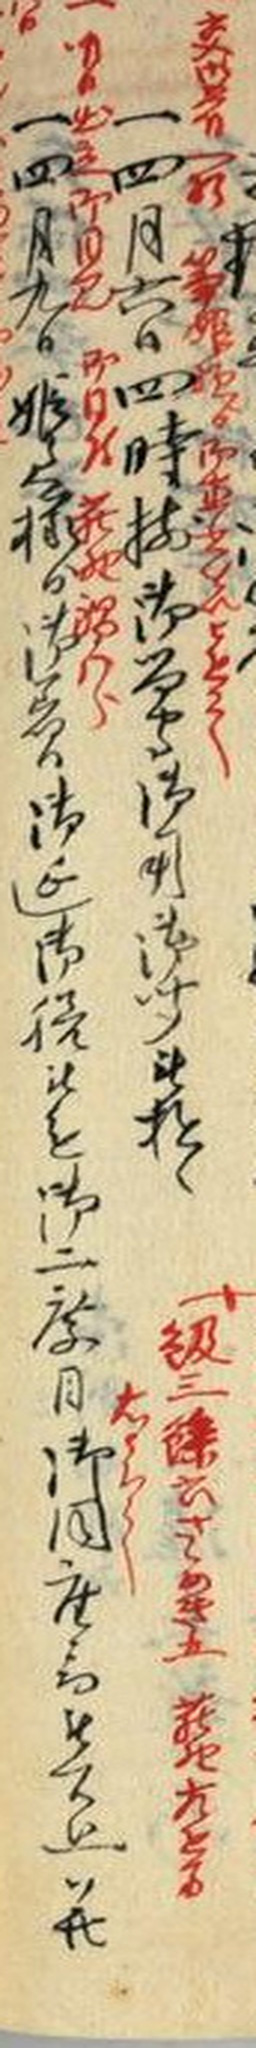一四月九日姫君様ゟ御着日御延御膳被進御二月度目御同座ニ而被召上候并
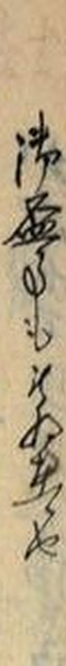御盃事も被為在候由
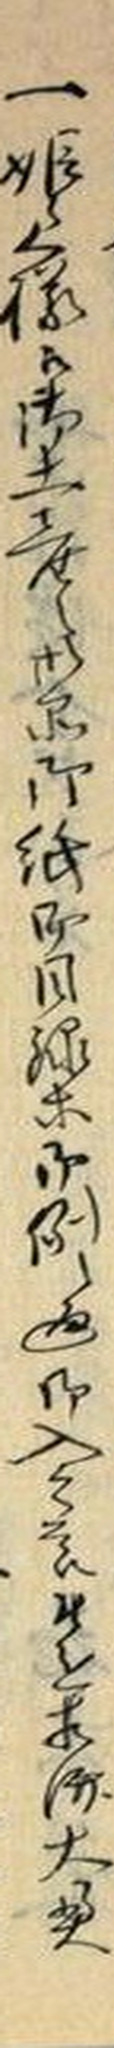一姫君様江御土産之御品御紙御目録等御例之通御入之節被進相済大奥
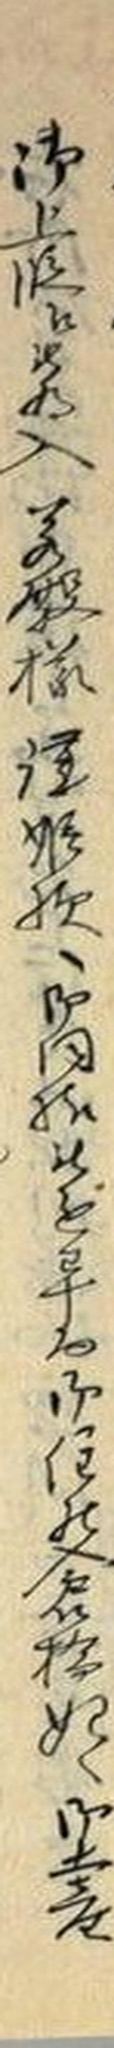御上段江被為入若殿様謹姫様へ御同様被進畢而御住居倉橋始へ御土産
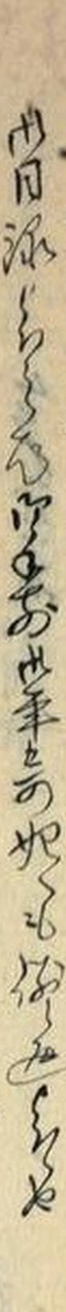御目録被下之尤御手前御年寄始へも例之通被下候由
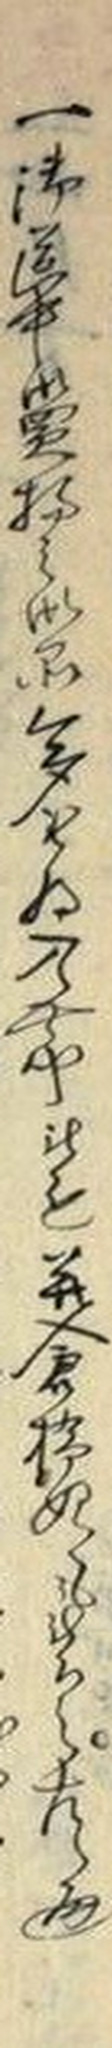一御道中御買揚之御品多被為入候節被進并倉橋始へも被下之左之通
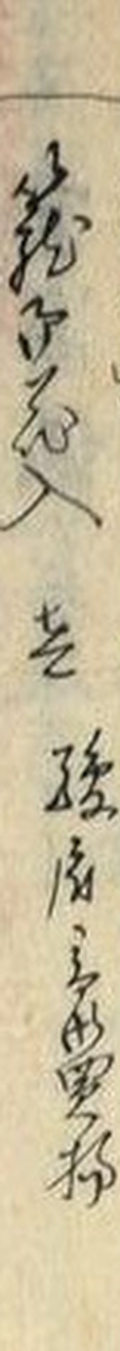籠御花入壱駿府ニ而御買揚
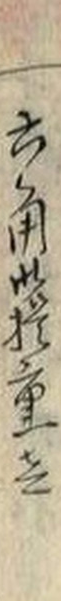六角御提重壱
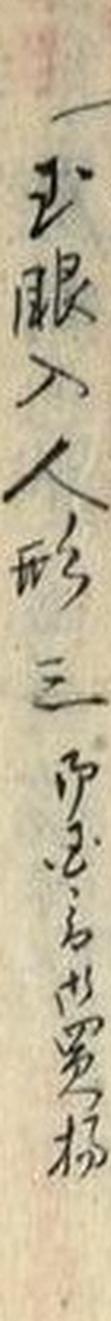玉眼入人形三御国ニ而御買揚
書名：少傅日録抄（斉承付側向頭取日記、在府）
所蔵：福井県文書館 Fukui Prefectural Archives
